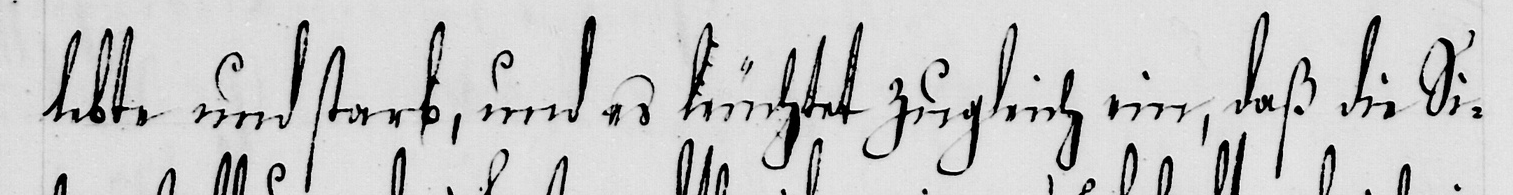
lebte und starb, und es leuchtet zugleich ein, daß die
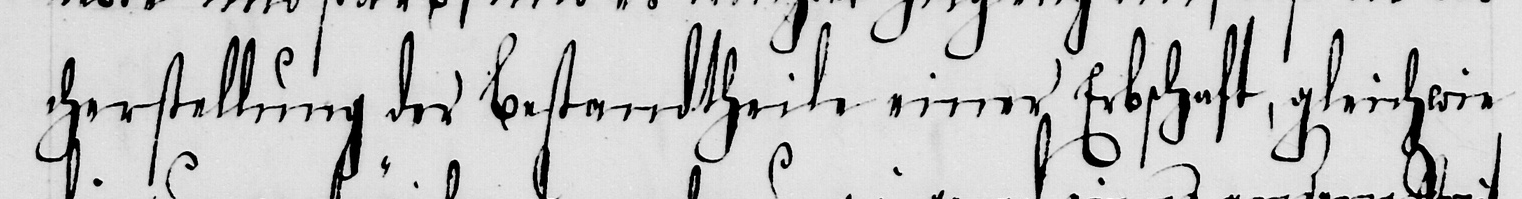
cherstellung der Bestandtheile einer Erbschaft, gleichwie
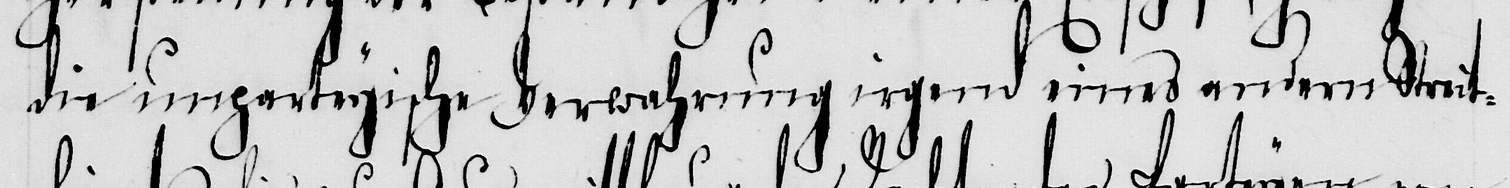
die unparteyische Verwahrung irgend eines andern Streit¬
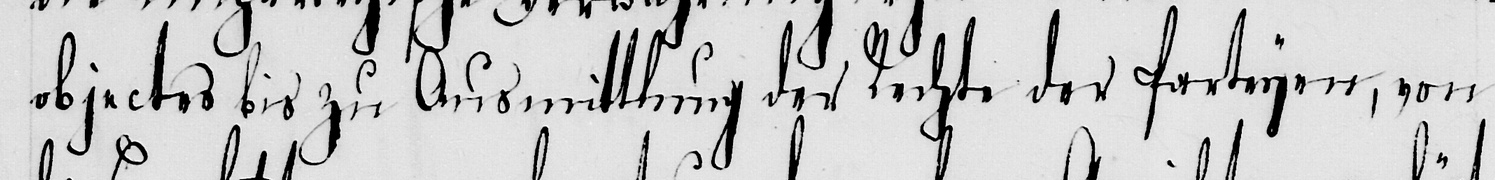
objectes bis zu Ausmittlung der Rechte der Parteyen, von
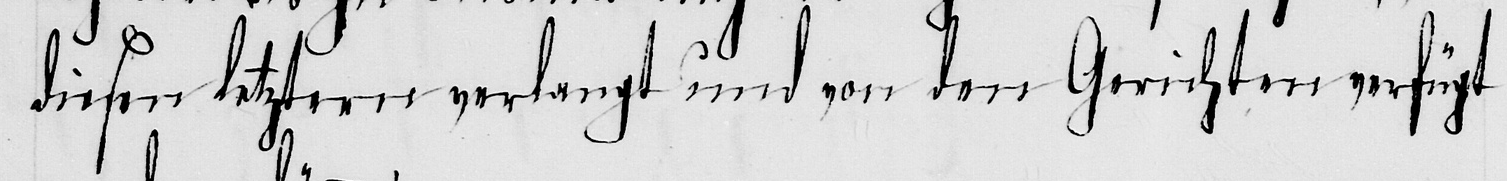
diesen letztern verlangt und von den Gerichten verfügt
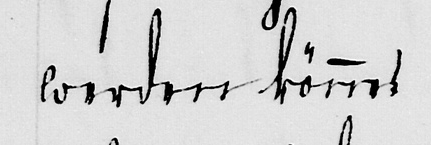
werden könn¬
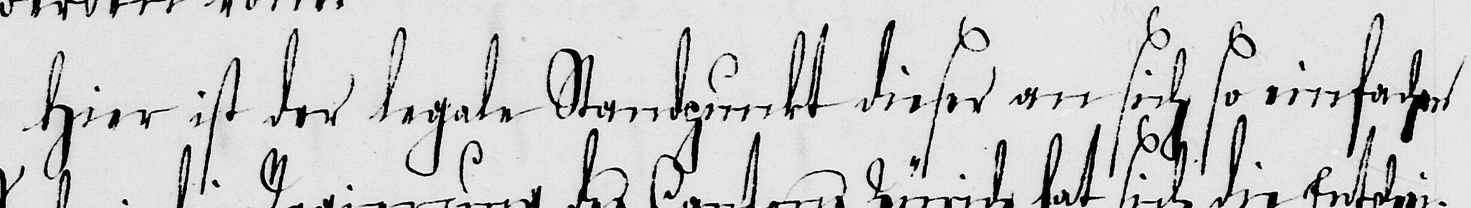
Hier ist der legale Standpunkt dieser an sich so einfach¬
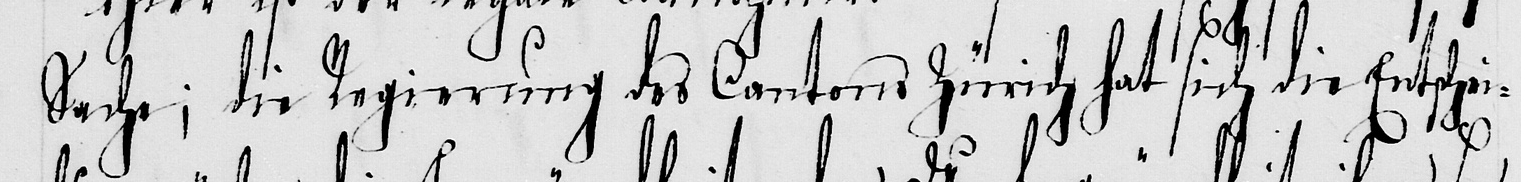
Sache; die Regierung des Cantons Zürich hat sich die Entschei¬
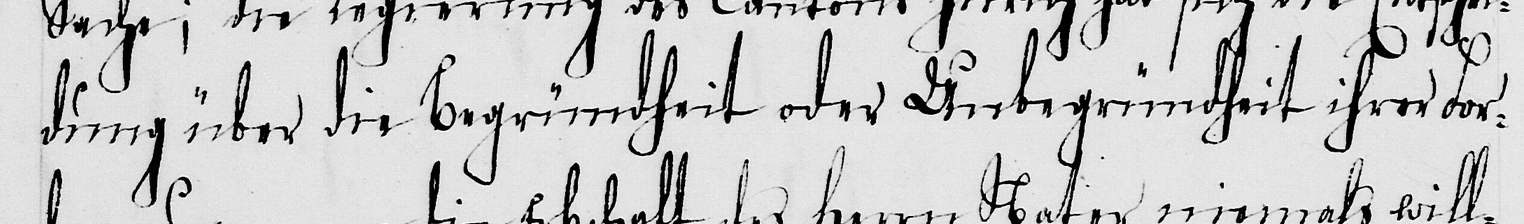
dung über die Begründheit oder Unbegründheit ihrer Fo¬
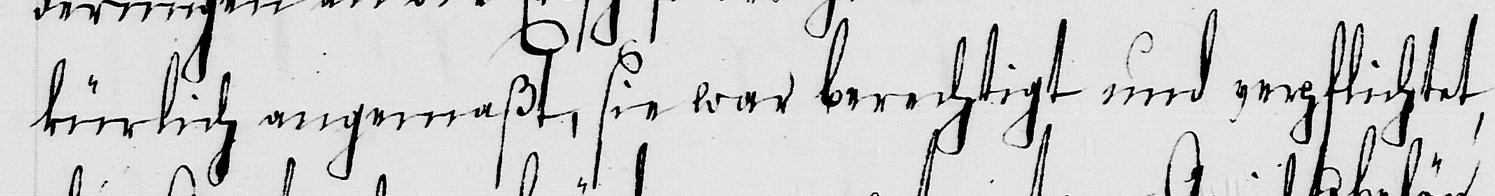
kürlich angemaßt, sie war berechtigt und verpflichtet,
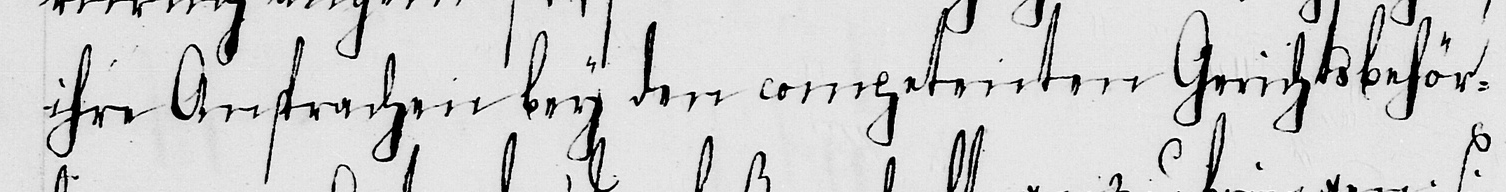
ihre Ansprachen bey den competenten Gerichtsbehör¬
